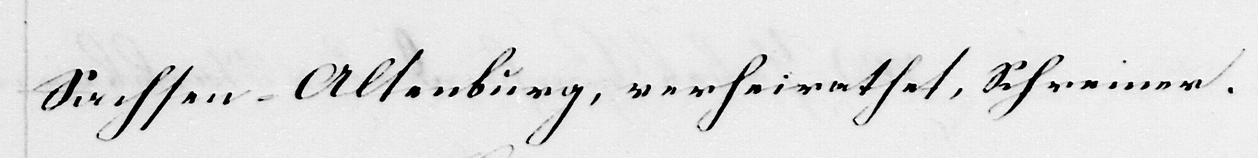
Sachsen-Altenburg, verheirathet, Schreiner.
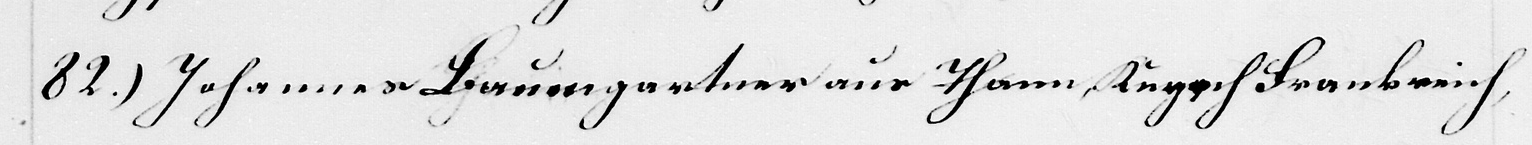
82.) Johannes Baumgartner aus Thann, Kngrch Frankreich,
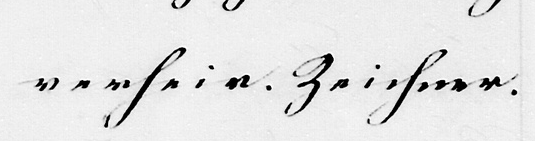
verheir. Zeichner.
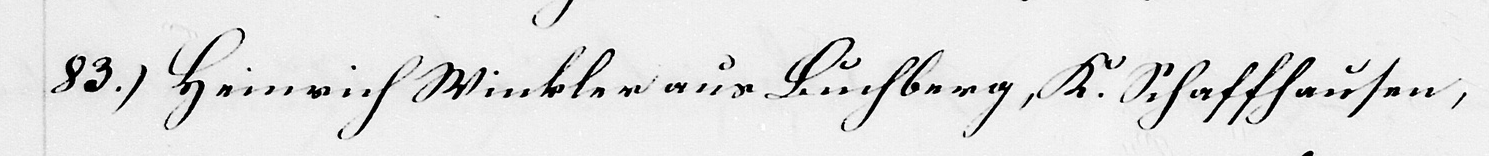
83.) Heinrich Winkler aus Buchberg, K. Schaffhausen,
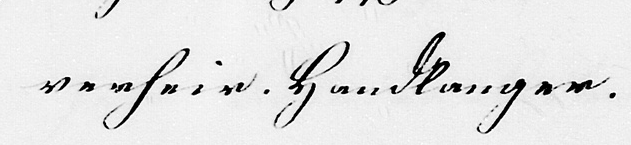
verheir. Handlanger.
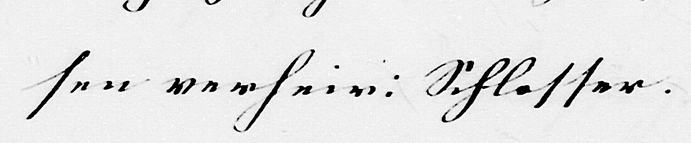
sen verheir: Schlosser.
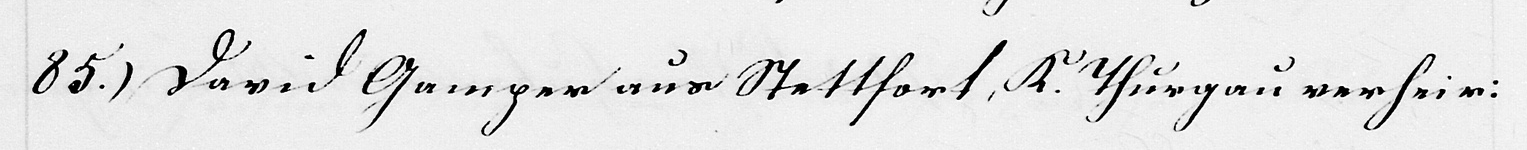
85.) David Gamper aus Stettfort, K. Thurgau verheir:
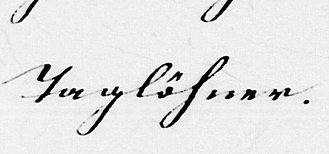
Taglöhner.
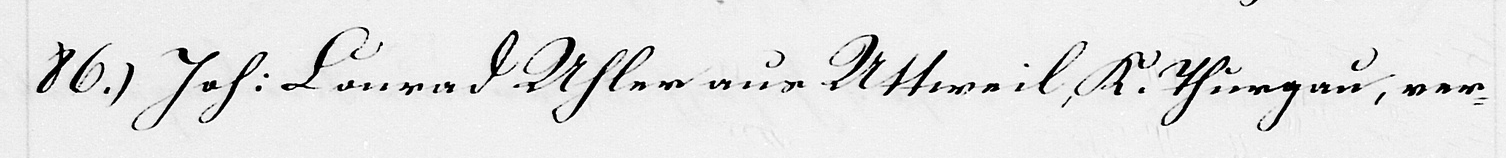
86.) Joh: Conrad Uhler aus Uttweil, K. Thurgau, ver¬
